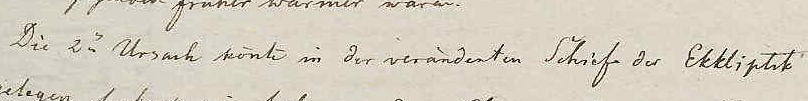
Die 2￼ Ursach könte in der veränderten Schiefe der Ekkliptik
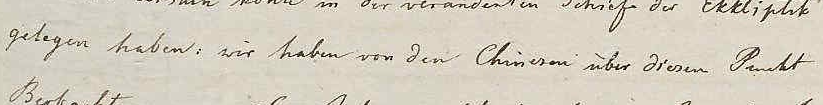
gelegen haben: wir haben von den Chinesen über diesen Punkt
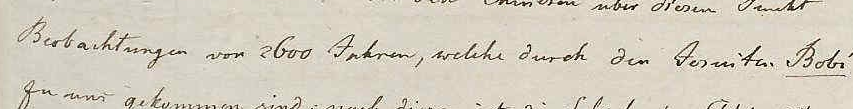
Beobachtungen von 2600 Jahren, welche durch den Jesuiten Bobi
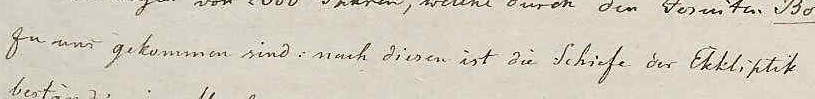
zu uns gekommen sind: nach diesen ist die Schiefe der Ekkliptik
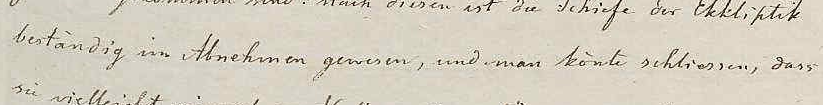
beständig im Abnehmen gewesen, und man könte schliessen, dass
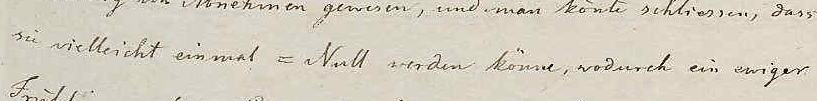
sie vielleicht einmal Null werden könne, wodurch ein ewiger
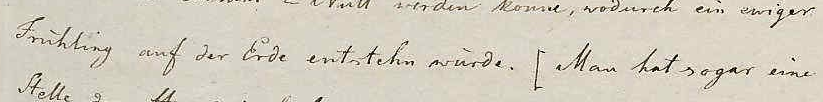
Frühling auf der Erde entstehn würde. [Man hat sogar eine
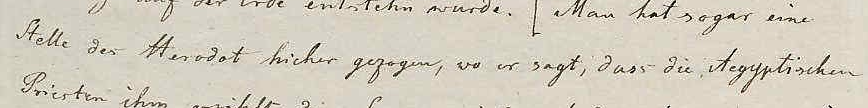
Stelle des Herodot hieher gezogen, wo er sagt, dass die Aegyptischen
